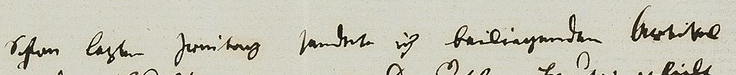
Schon lezten Junitag sandte ich beiliegenden Artikel
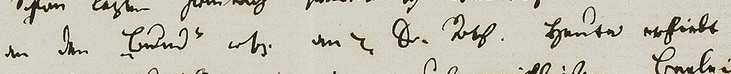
an den «Bund» usw. an Herrn Dr. Roth. Heute erhielt
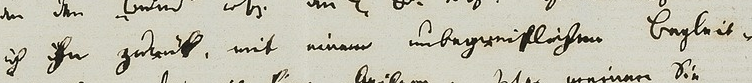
ich ihn zurük, mit einem unbegreiflichen Begleit-
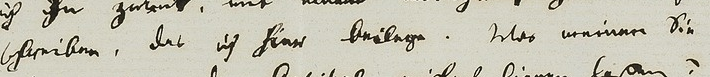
schreiben, das ich hier beilege. Was meinen Sie
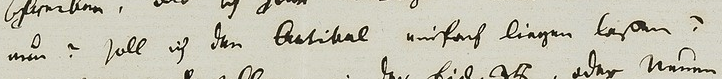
nun? Soll ich den Artikel einfach liegen lassen?
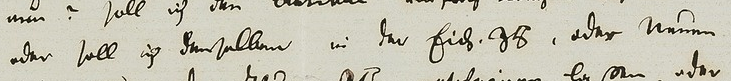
oder soll ich denselben in der Eidg. Ztg. oder Neuen
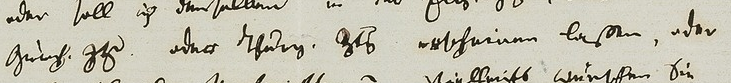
Zürch. Ztg. oder Thurg. Ztg erscheinen lassen, oder
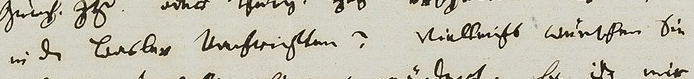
in den Basler Nachrichten? Vielleicht wünschen Sie
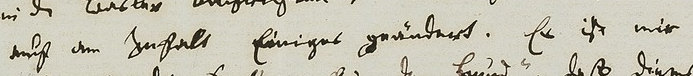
auch am Inhalt Einiges geändert. Es ist mir
